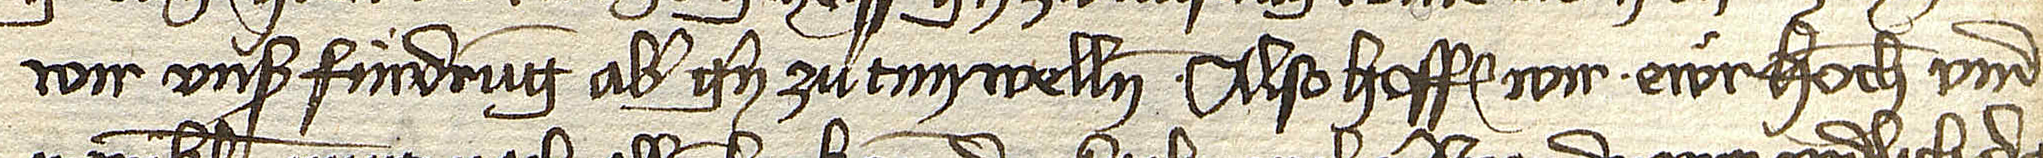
wir vnſ* fürdr*g ab* g*n ʒu tun welln* . Alſo hoff* wir eẅr hoch* vnd
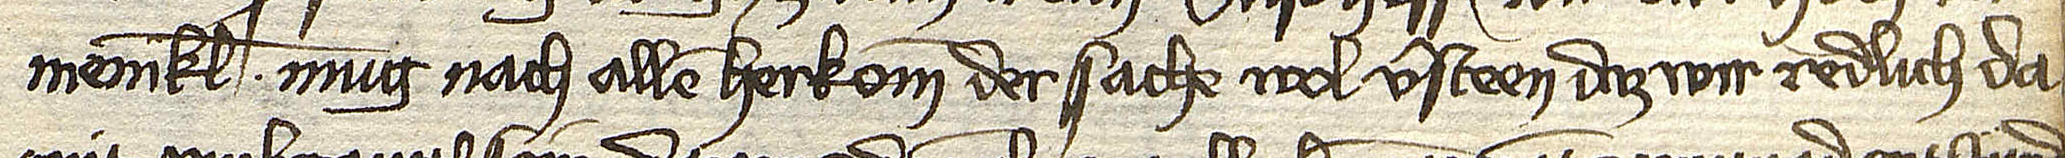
menikl* mug nach alle* herkom* der ſache wol v*ſteen daʒ wir redlich da
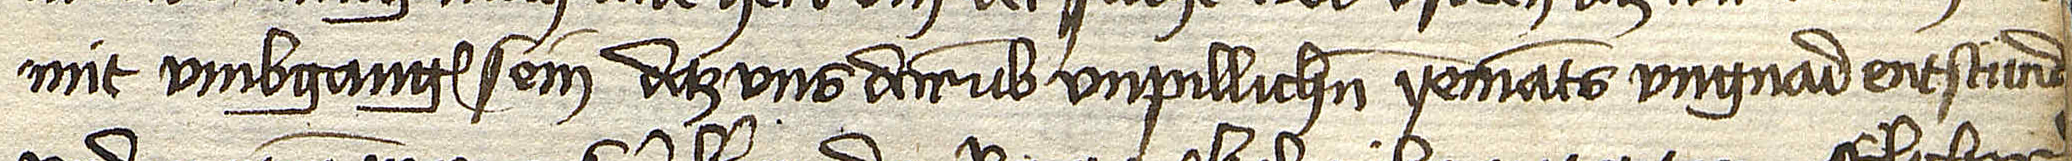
mit vmbgang* ſein daʒ vns darub* vnpillichn* yema*ts vngnad entſtund
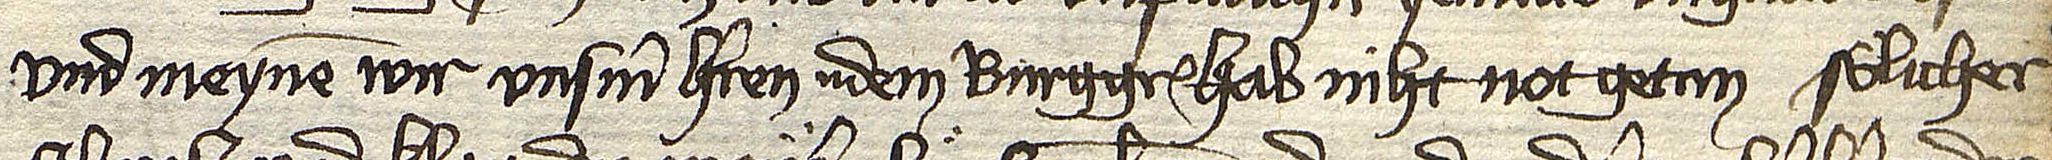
vnd meyne* wir vnſm* h*ren ~ dem Burggr* niht not getan / ſölicher
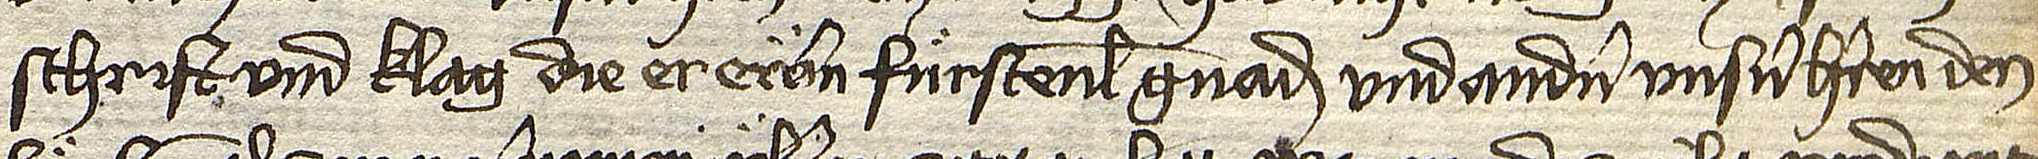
ſchrift vnd klag die er eẅ*n fürſtenl* gnad* vnd andn* vnſn* h*ren den
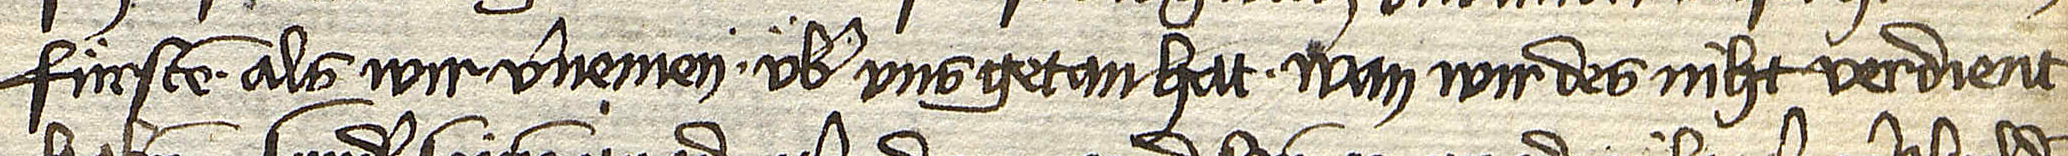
fürſte* . als wir v*nemen v̈b* vns getan hat . wan wir des niht verdient
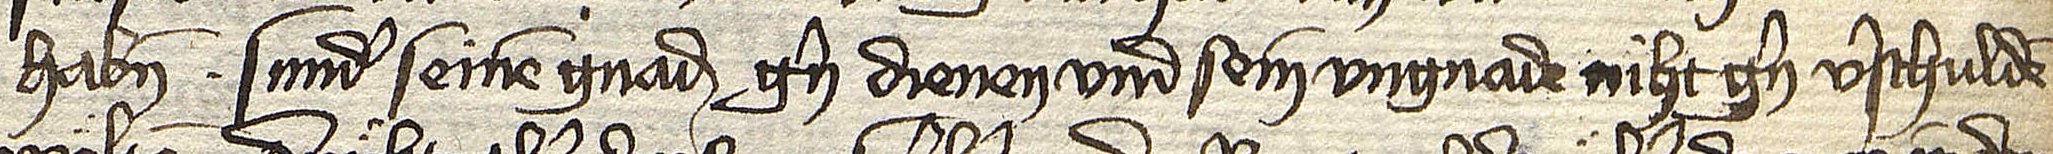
habn* . ſund* ſeine* gnad* g*n dienen vnd ſein vngnade niht g*n v*ſchulde*
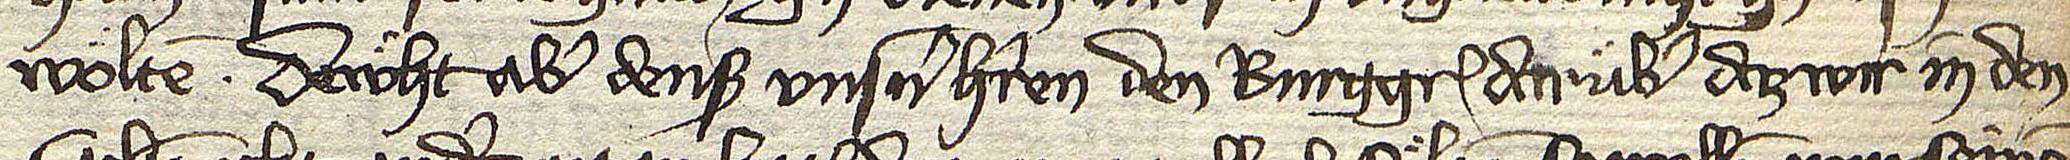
wölte* . Deẅht ab* denſ* vnſn* h*ren den Burggr* darüb* daʒ wir in den
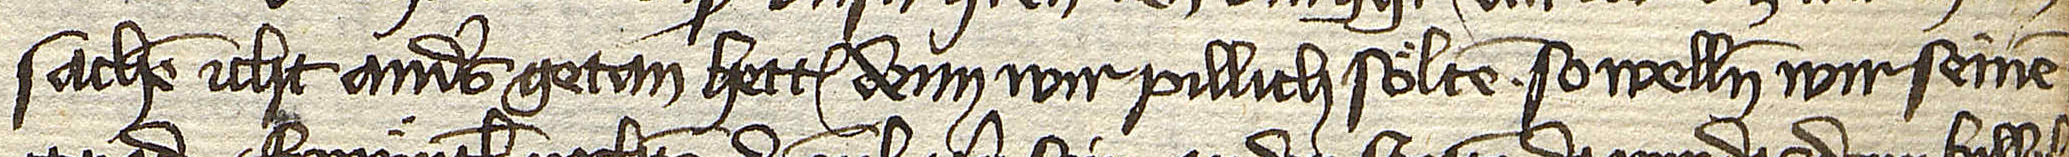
ſache* icht and*s getan hett* denn wir pillich ſölte* . ſo welln* wir ſeine*
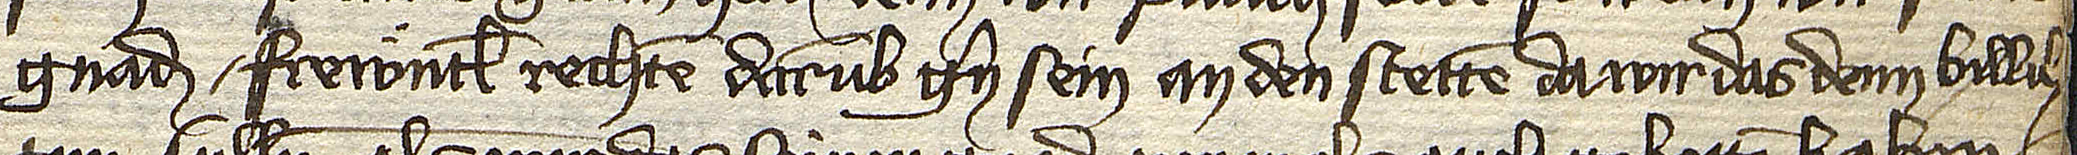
gnad* / freẅntl* rechte* darub* g*n ſein an den ſtette* da wir das denn billich
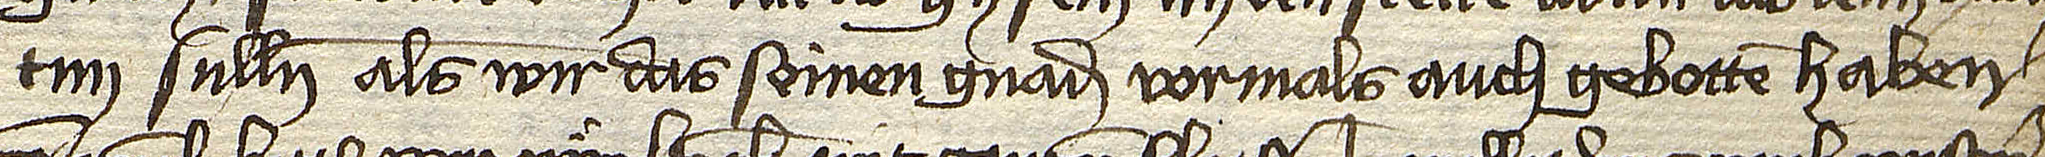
tun ſulln* als wir das ſeinen gnad* vormals auch gebotte* haben
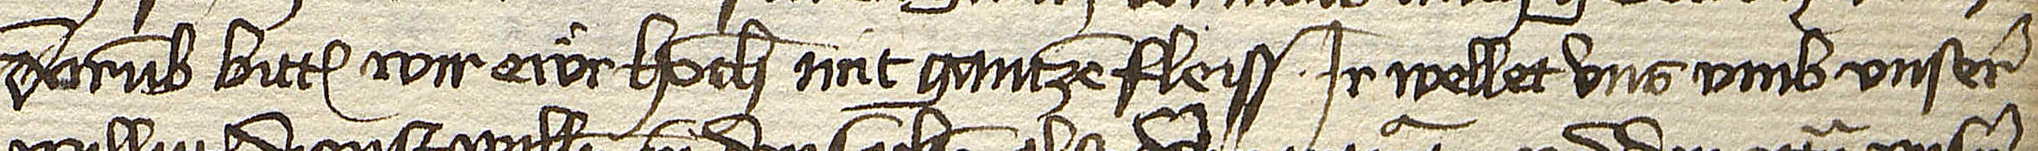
Darub* bitt* wir eẅr hoch* mit gancʒe* fleiſſ . Ir wellet vns vmb vnſer*
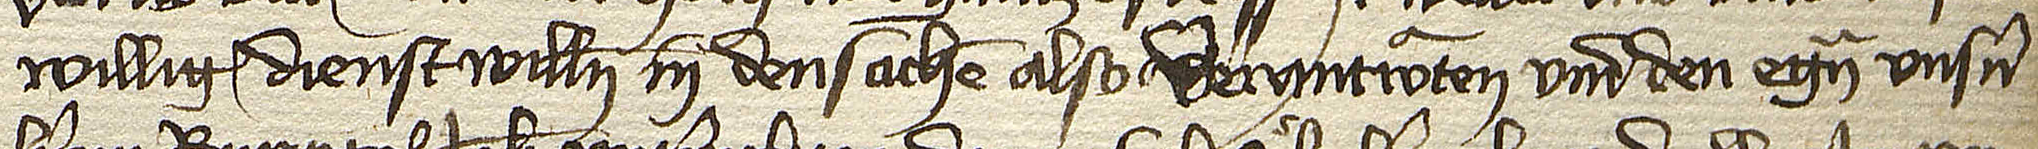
willig* dienſt willn* in den ſache* alſo Verantw*ten vnd den egn* vnſn*
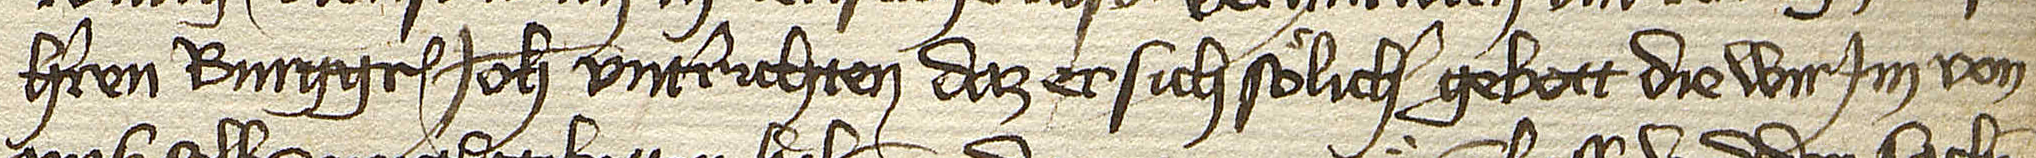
h*ren Burggr* Ioh* vnt*richten daʒ er ſich ſölich* gebott die wir Im von
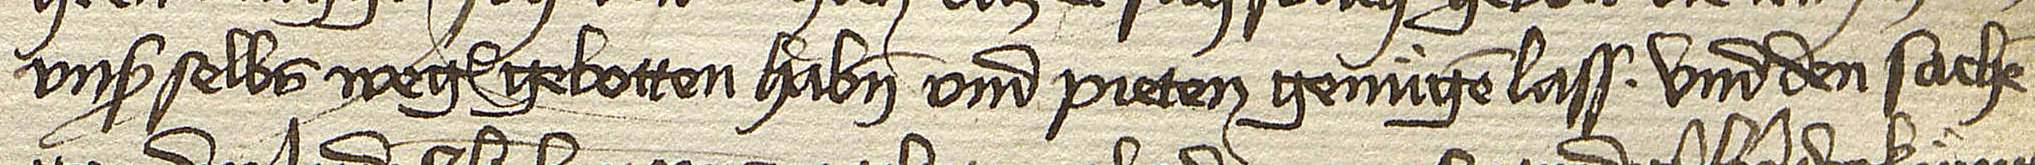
vnſ* ſelbs weg* gebotten habn* vnd pieten genüge* laſſ . vnd den ſache*
